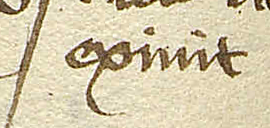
exiuit
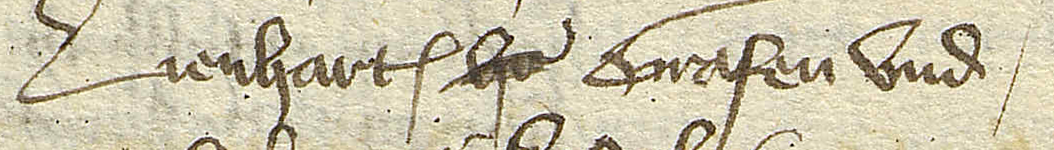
Lienhart* hr* Grafen vnd /
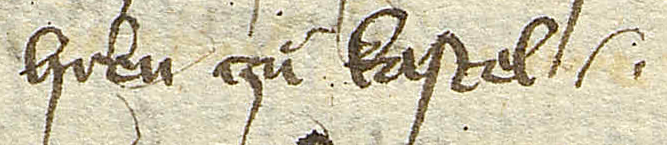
hr*en cʒü kaſtel / .
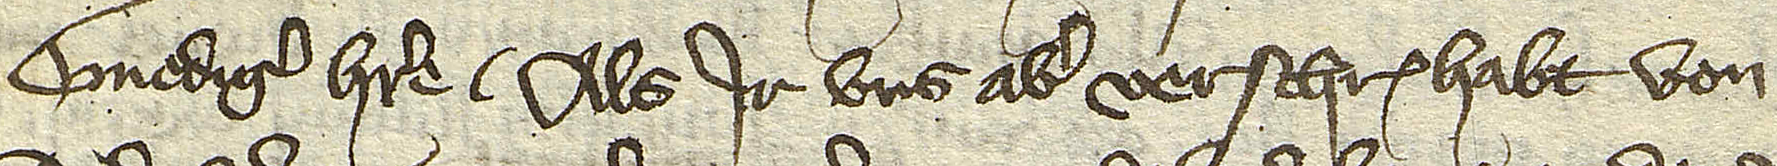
Gnedig* hr*e / Als Ir vns ab* verſchr* habt von
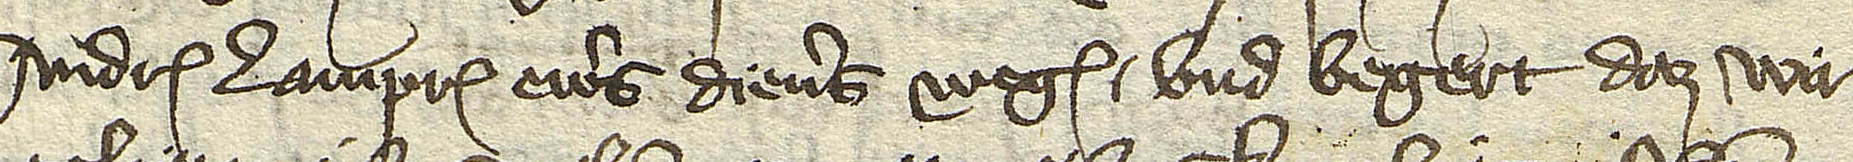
Andr* Lampr* ew*s dien*s weg* / vnd begert daʒ wir
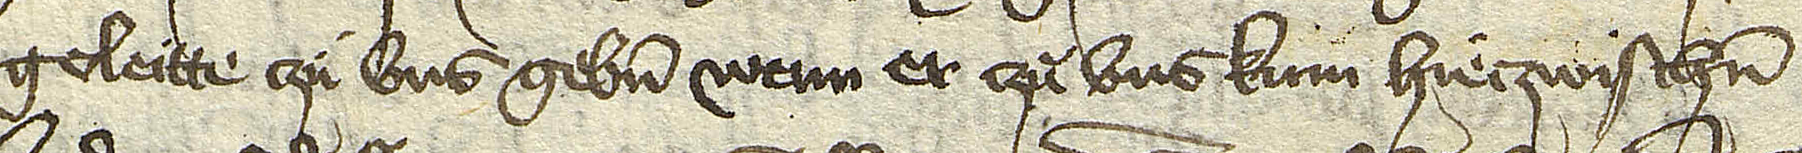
geleitte cʒü vns gebn* wenn er cʒü vns kum hiecʒwiſchn*
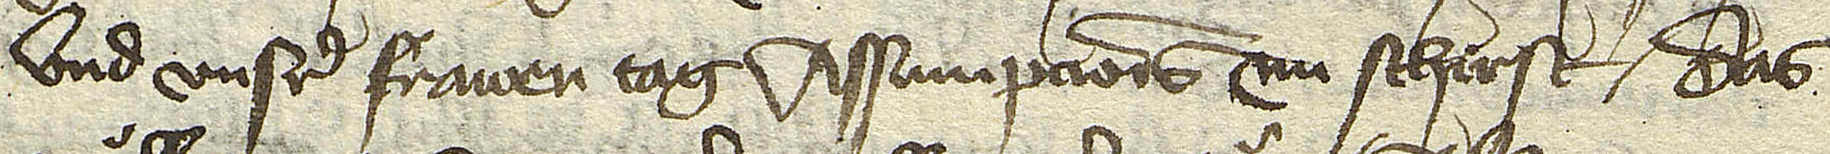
vnd vnſr* frawen tag Aſſumpciois* nu ſchirſt / Das
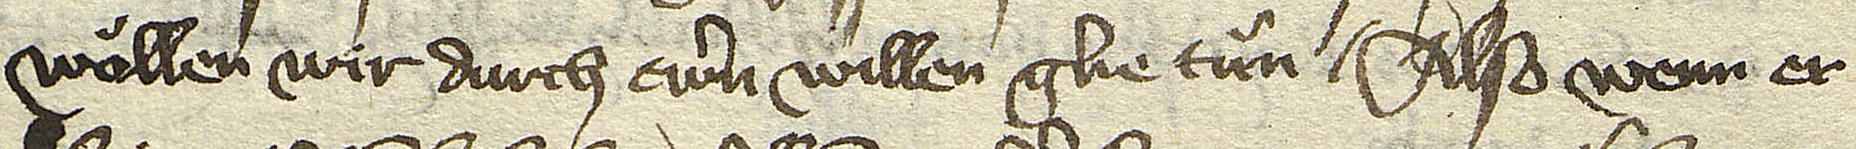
wöllen wir durch ew*n willen g*ne tün / Alſo wenn er
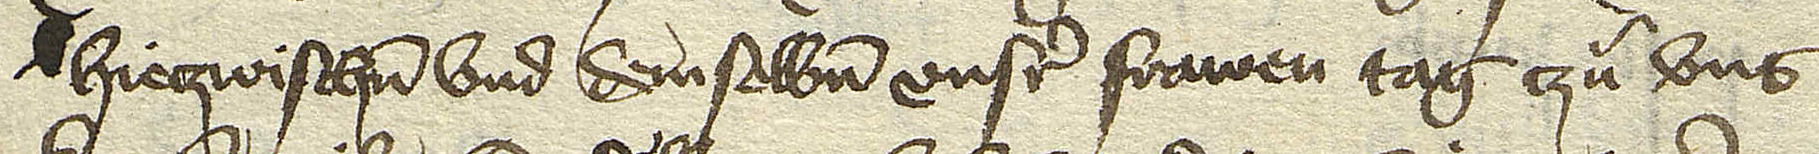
hiecʒwiſchn* vnd dem ſelbn* vnſr* frawen tag cʒü vns
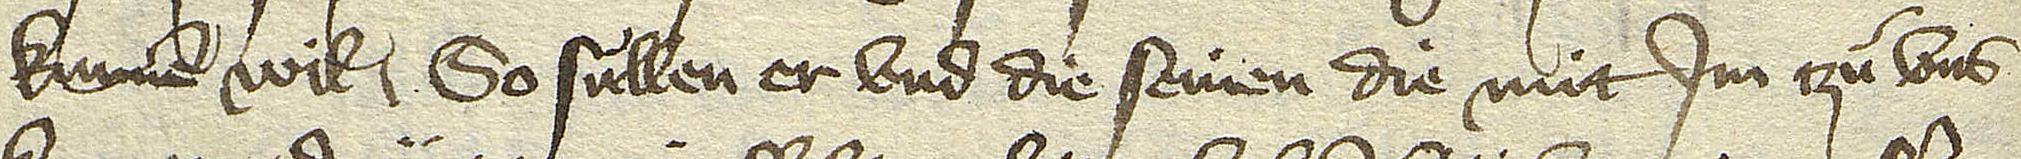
kume* wil / So ſüllen er vnd die ſeinen die mit Im cʒü vns
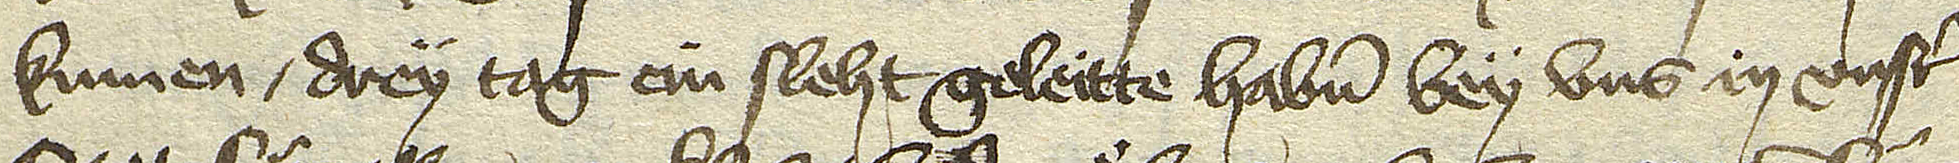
kumen / drey tag ein ſleht geleitte habn* bey vns in vnſr*
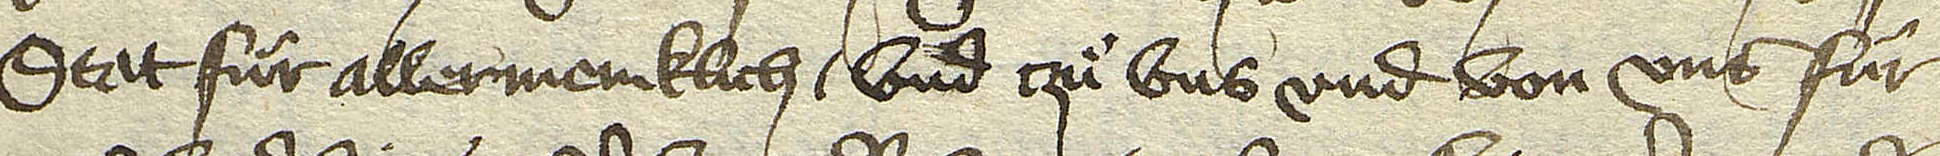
Stat für allermeniklich / vnd cʒü vns vnd von vns für
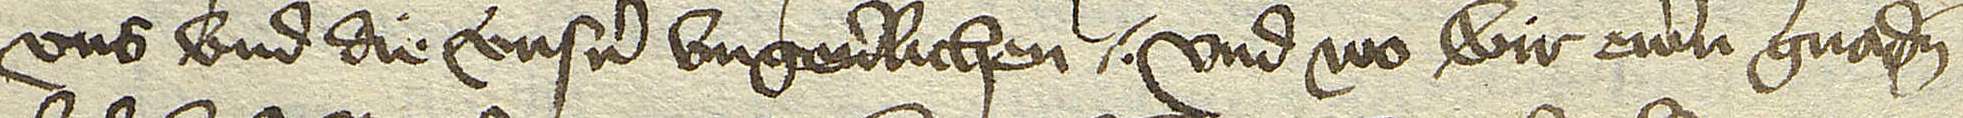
vns vnd die vnſn* vngeu*lichen / . vnd wo wir ew*n gnadn*
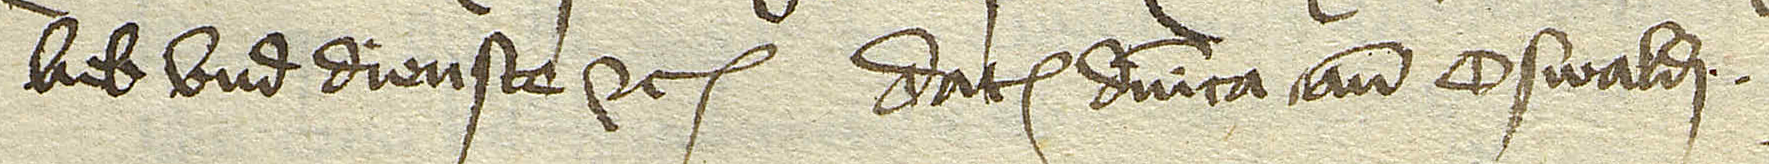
lieb vnd dienſte ec* Dat* dnica* an* Oſwaldi .
